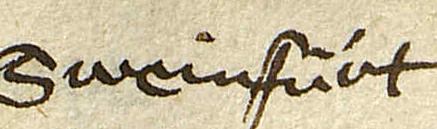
Sweinfürt
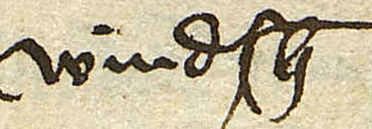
windſh*
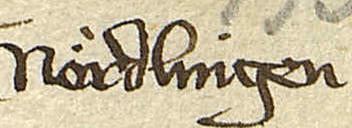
Nördlingen
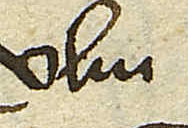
Vlm
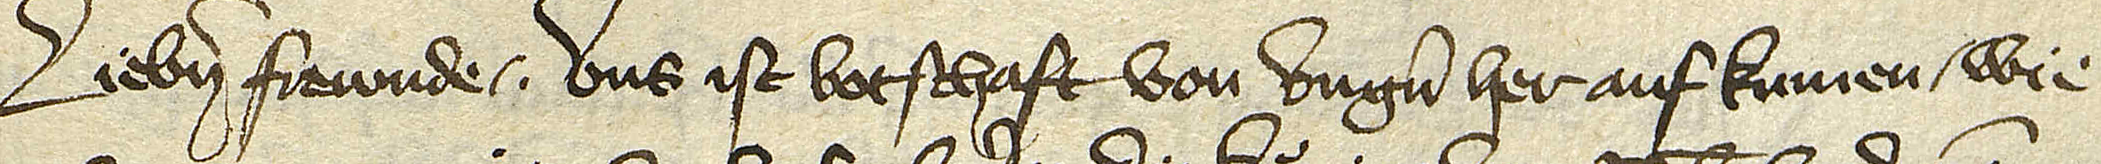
Liebn* Freunde / . Vns iſt botſchaft von Vngn* her auf kumen / wie
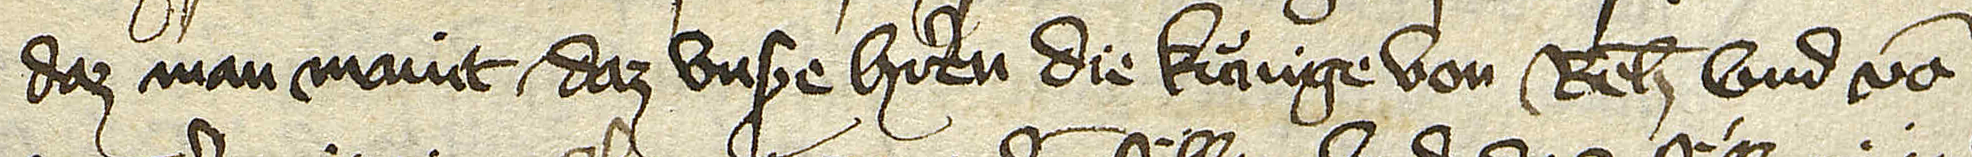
daʒ man maint / daʒ vnſ*e hr*en die künige von Beh* vnd vo*
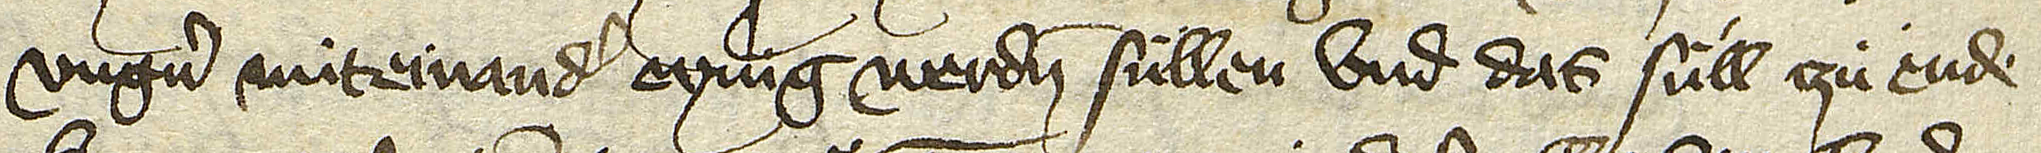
vngn* miteinand* eynig werdn* ſüllen vnd das ſüll cʒü ende
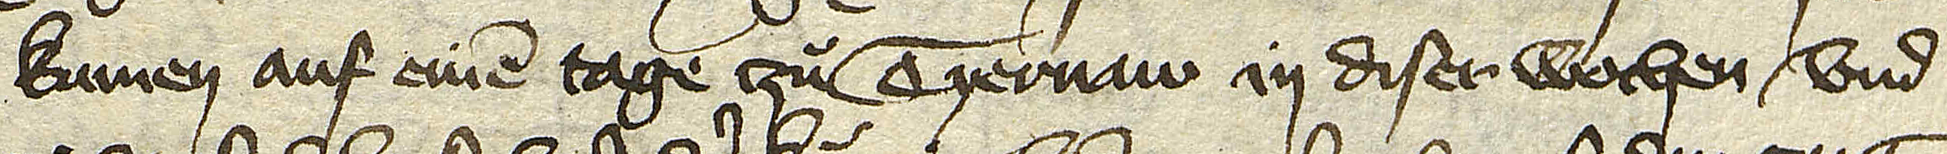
kumen auf eine* tage cʒü Tyernaw in diſer wochen / vnd
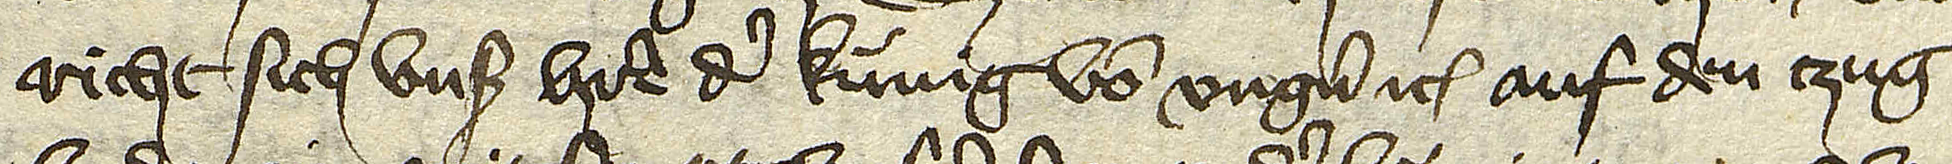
richt ſich vnſ* hr*e d* künig vo* vngn* ec* auf den cʒug
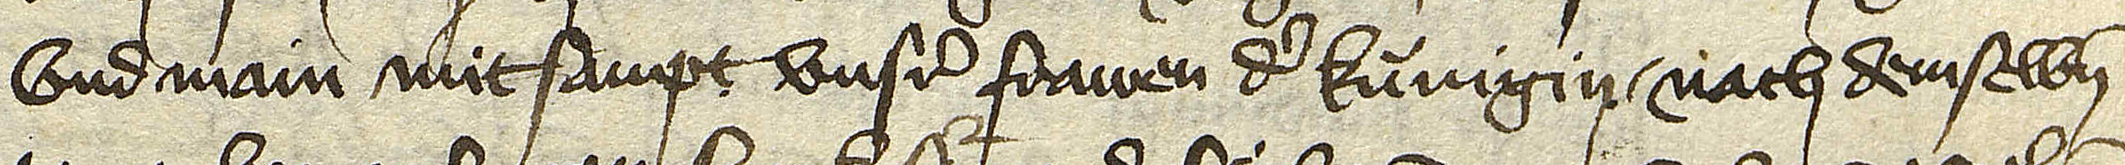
vnd main mit ſampt vnſr* frawen d* künigin / nach demſelbn*
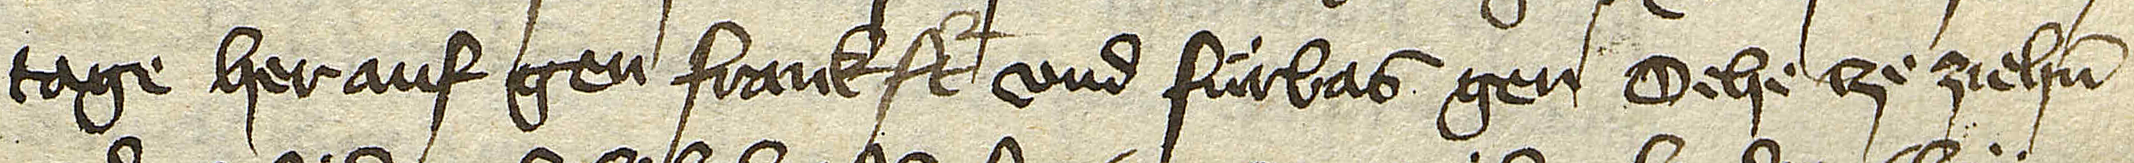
tage herauf gen frankft* vnd fürbas gen Oche cʒe ʒiehn*
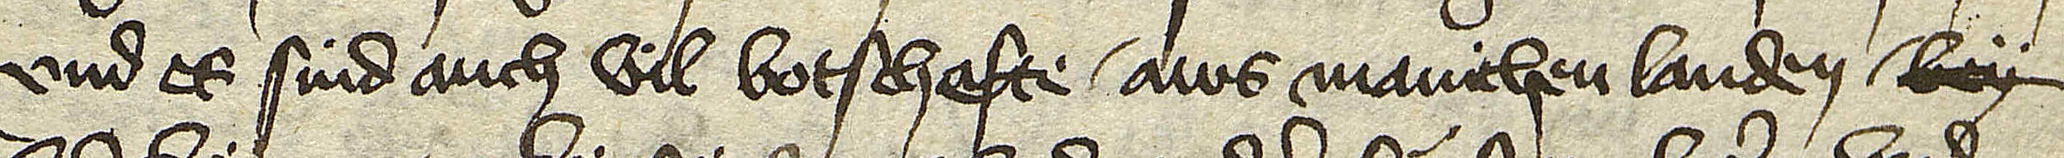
vnd es ſind auch vil botſchefte / aws manichen landen / bey
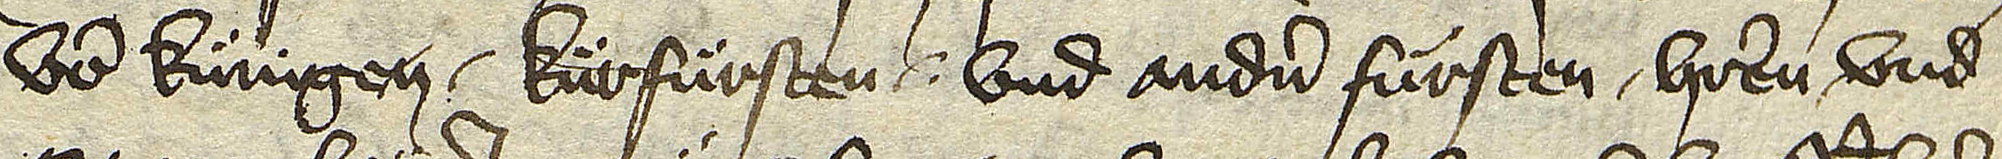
vo* künigen / kürfürſten / . vnd andn* fürſten / hr*en / vnd
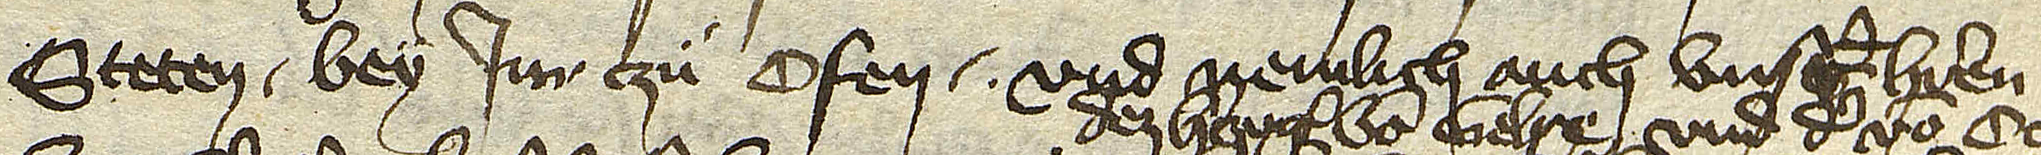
Steten / bey Im cʒü Ofen / . vnd nemlich auch vnſr* hr*en
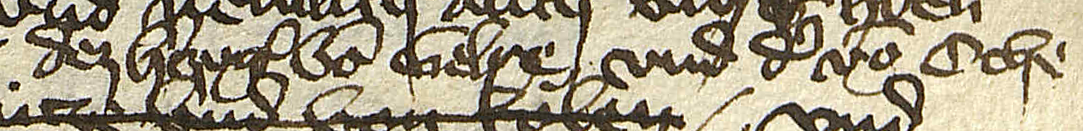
deʒ h*cʒug* vo* Gelre vnd d* vo* Oche
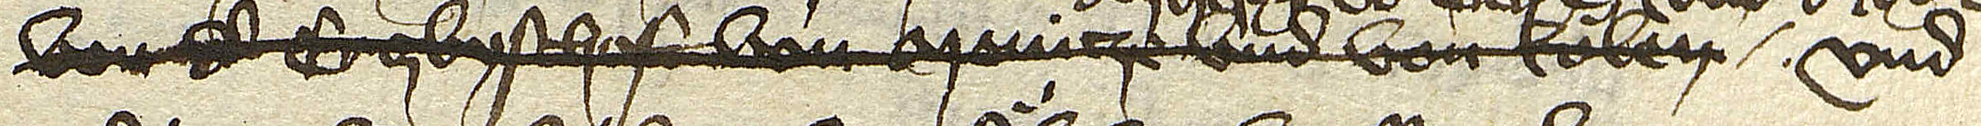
von d* Ercʒbyſchofn von Meincʒe vnd von Kölen / . vnd
